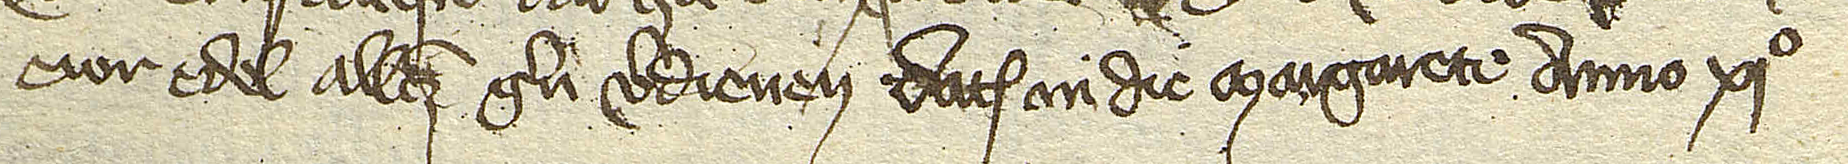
ewr edel allcʒ* g*n v*dienen dat* in die Margarete Anno xi*
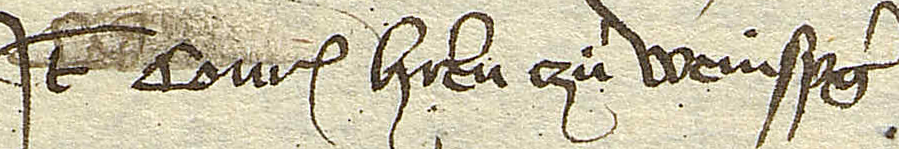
It Conr* hr*en cʒü Weinſpg*
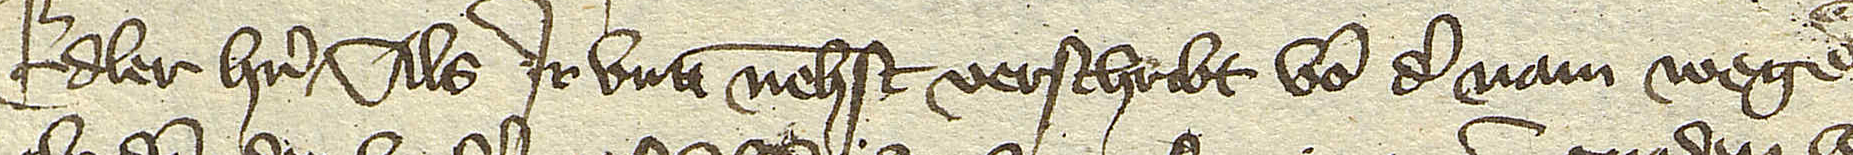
Edler hr* / Als Ir vns nehſt verſchribt vo* nam wege*
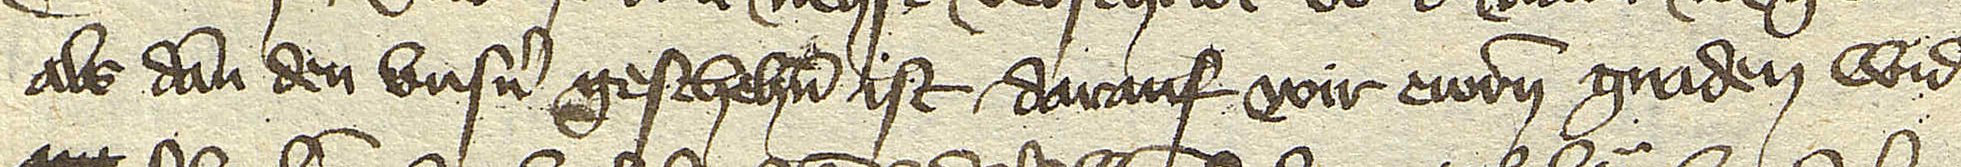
als dan* den vnſn* geſchehn* iſt / darauf wir ewrn* gnaden wid*
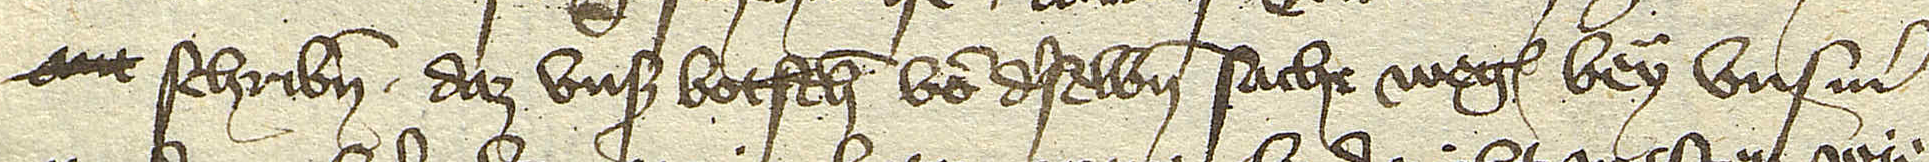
ant ſchribn* / daʒ vnſ* botſch* vo* d*ſelbn* ſache weg* bey vnſm*
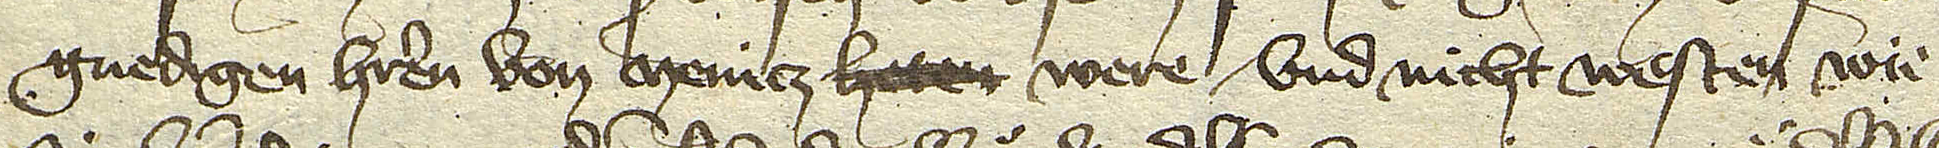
gnedigen hr*en von Meincʒ heten were / vnd nicht weſten wie
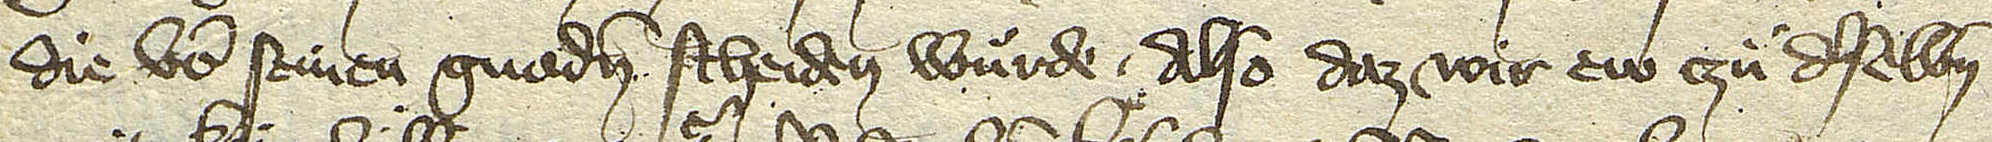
die vo* ſeinen gnadn* ſcheiden würde / Alſo daʒ wir ew cʒü d*ſelbn*
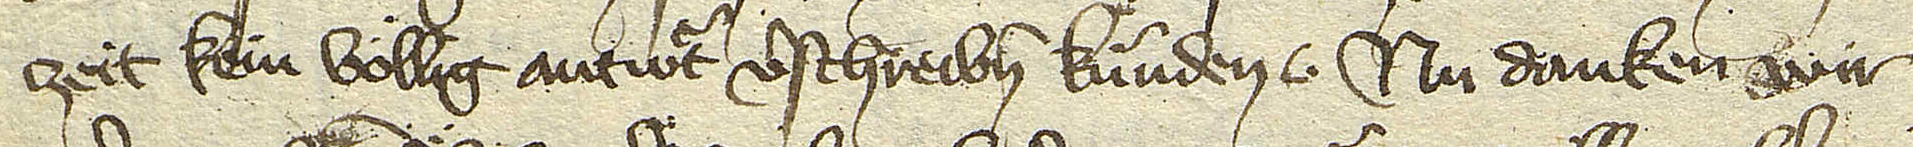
cʒeit kein völlig antwt* v*ſchreibn* künden / . Nu danken wir
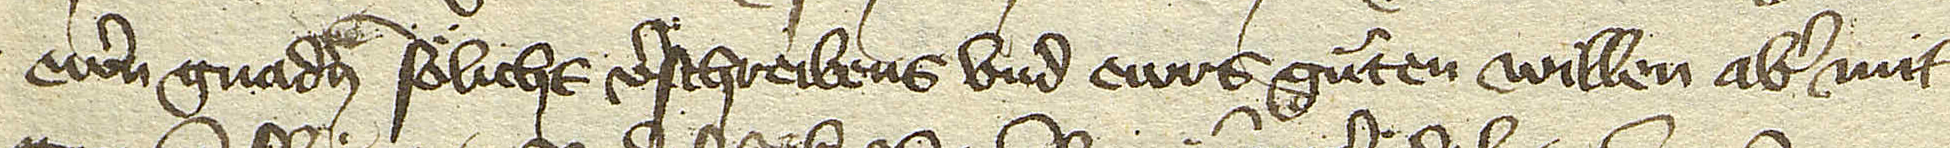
ew*n gnadn* ſölichs v*ſchreibens vnd ewrs güten willen ab* mit
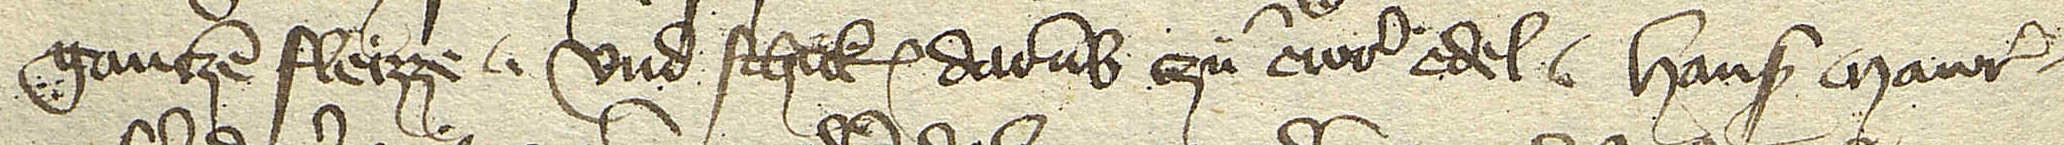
gancʒe* fleiʒʒ / vnd ſchick* darub* cʒu ewr* edel / hanſ* Mawr* /
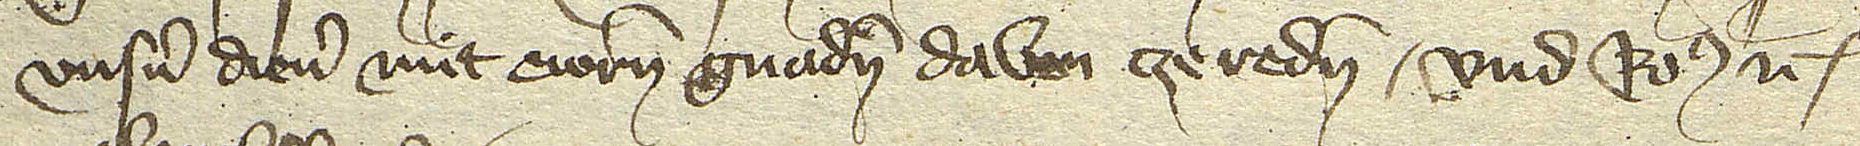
vnſ*n dien* mit ew*rn gnadn* davon cʒe redn* / vnd Ro* ec* /
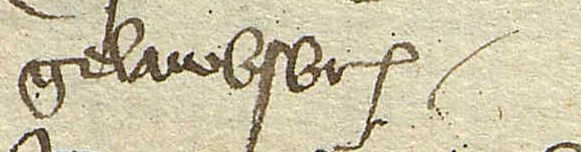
gelawbſbr* /
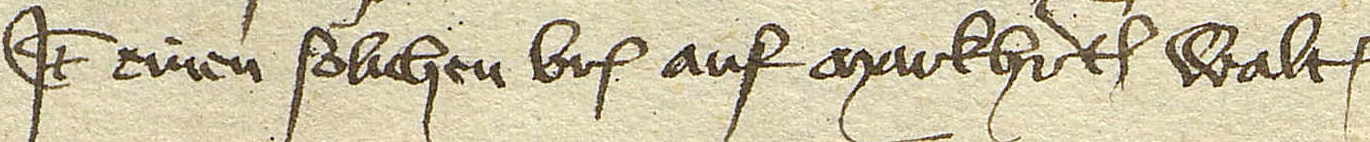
It einen ſölichen br* auf Markhrt* Walt*
